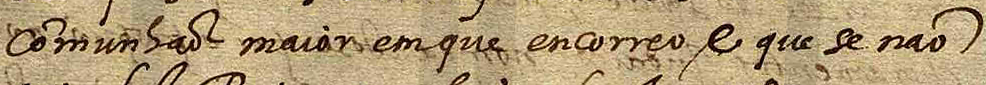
cōmunhaõ maior em que encorreo, e que se naõ
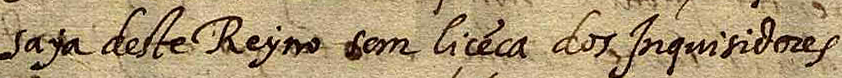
saya deste Reyno sem liçēça dos Jnquisidores
